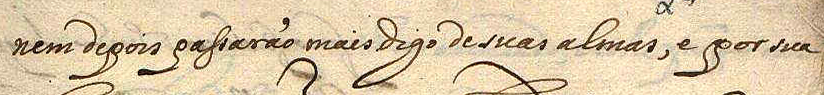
nem depois passarão mais digo de suas almas, e por sua
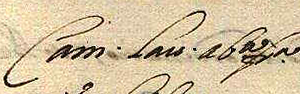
Cam. lau. a 6.a fr.a
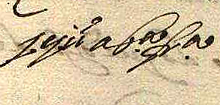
jejū a 6.a fr.a
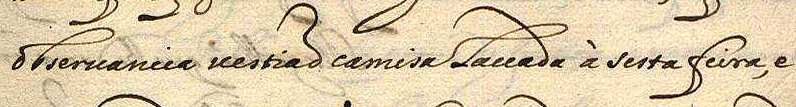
obseruancia uestiaõ camisa lauada à sesta feira, e
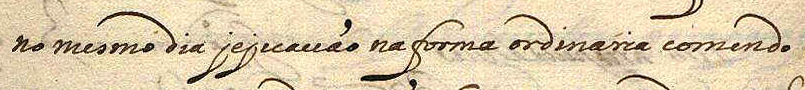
no mesmo dia jejuauaõ na forma ordinaria comendo
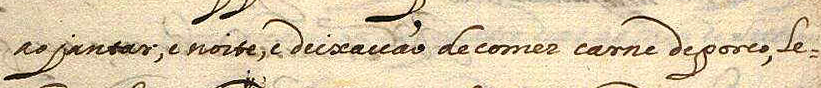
ao jantar, e noite, e deixauão de comer carne de porco, le
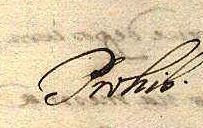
Prohib.
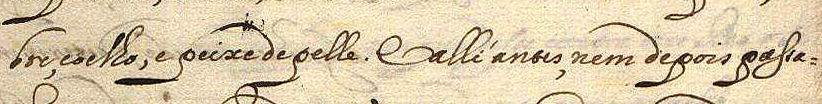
bre coelho, e peixe de pelle. E alli antes, nem depois passa
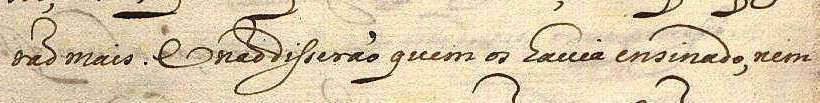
raõ mais. E naõ disseraõ quem os hauia ensinado, nem
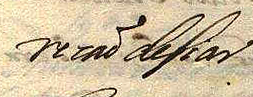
rezaõ de fiar
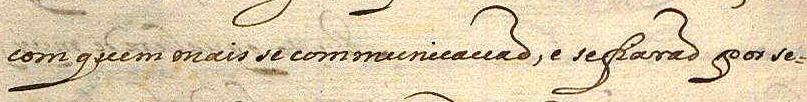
com quem mais se communicauaõ, e se fiaraõ por se
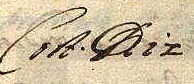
Cost. Diz
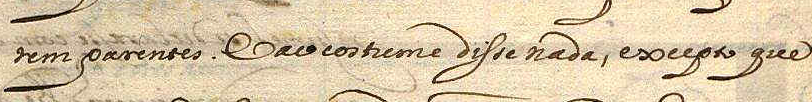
rem parentes. E ao costume disse nada, excepto que
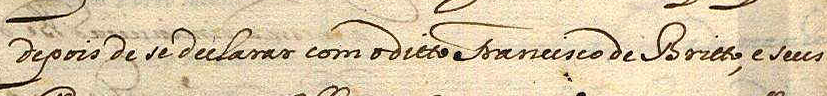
depois de se declarar com o ditto Francisco de Britto, e seus
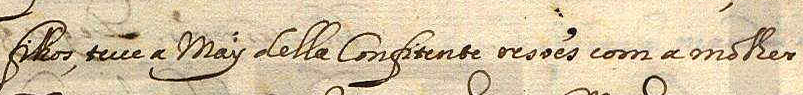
filhos, teue a May della Confitente resoẽs com a molher
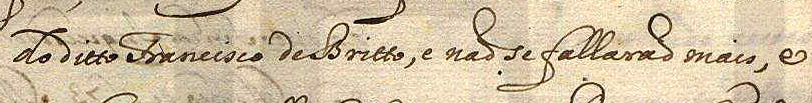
do ditto Francisco de Britto, e naõ se fallaraõ mais, e
